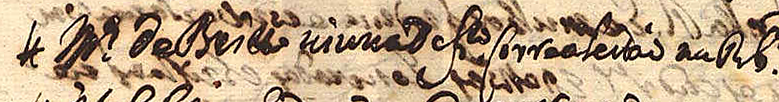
Item M.a de Britto uiuua de f.co Correa Leitaõ da Rib.ra
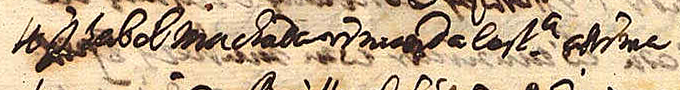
Item Jsabel machada irmam da test.a a asȳma
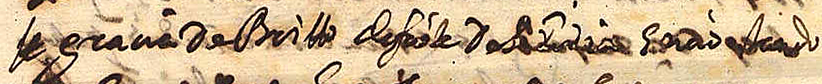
Item gracia de Britto defrōte de S. yria E naõ estando
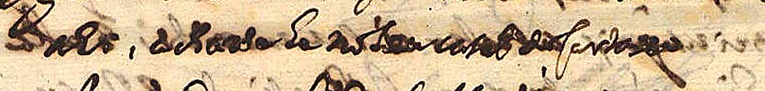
ahi, acharseha no seu curral do Cartaxo
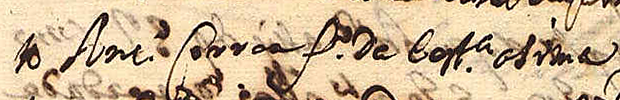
Item Ant.o Correa f.o da test.a asyma
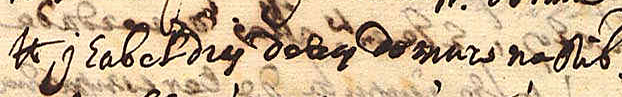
Item jsabel dias detras do muro na Rib.ra
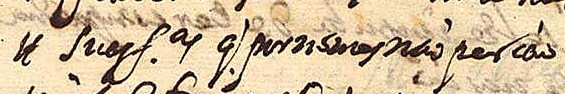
Item Suas f.as q̄ per nomes naõ percaõ
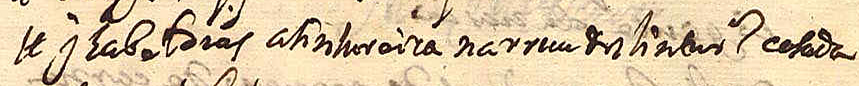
Item Izabel dias a tintoreira na rrua dos tintur.os casada
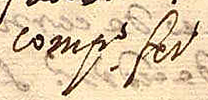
com p.o fr.z
